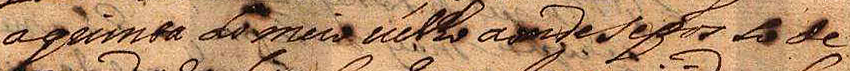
a quinta do meio uelho aonde se pos so de
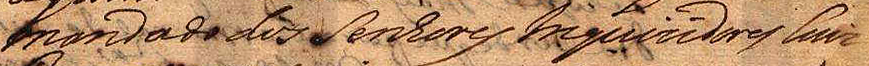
mandado dos Senhores Inquizidores luiz
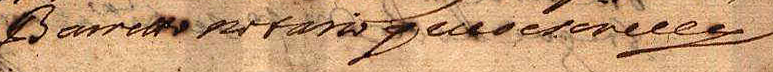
Barretto notario que o escreuy
